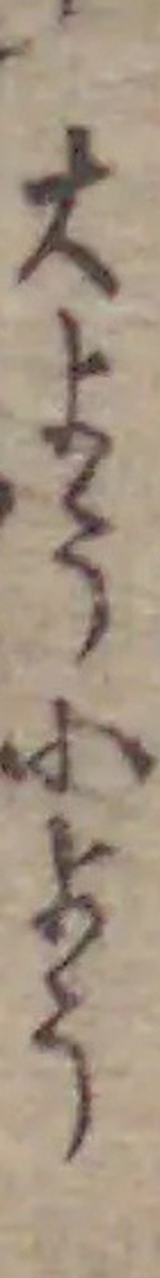大よう小よう
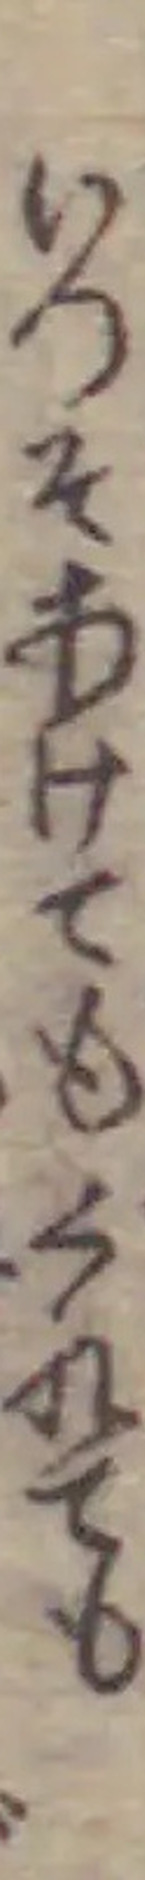いつそあけてもくれても
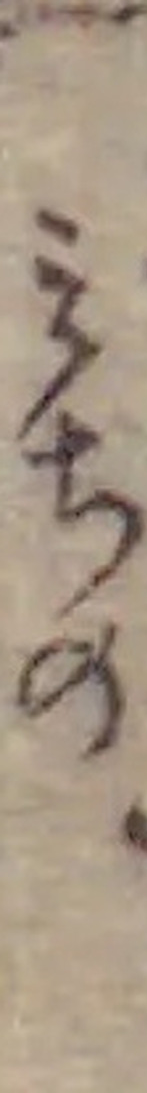みちの
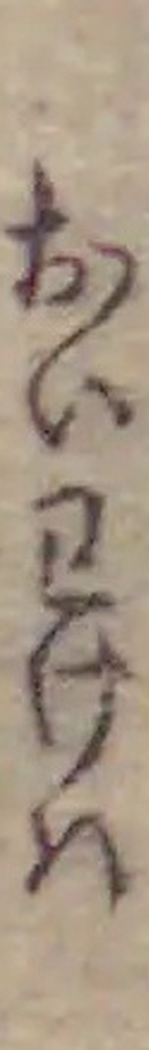おいわけは
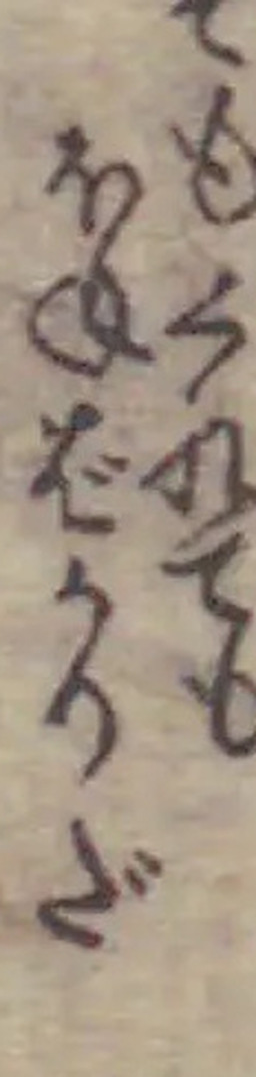ほねばかりだ
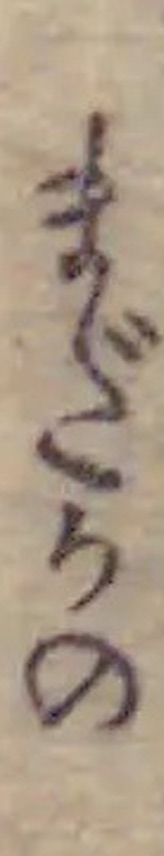まだかの

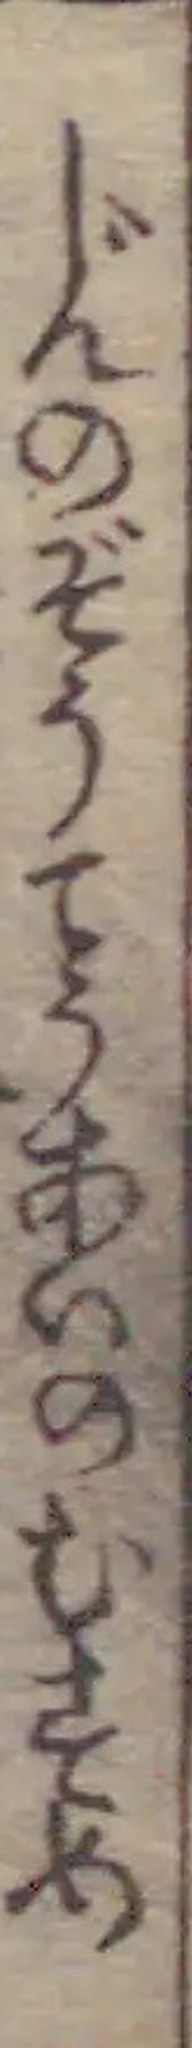じんのぞうてうあいのむすめ
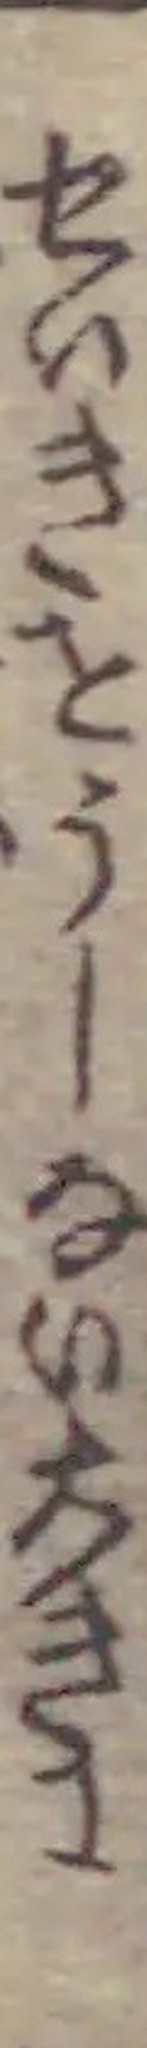せいきをうしない大きに
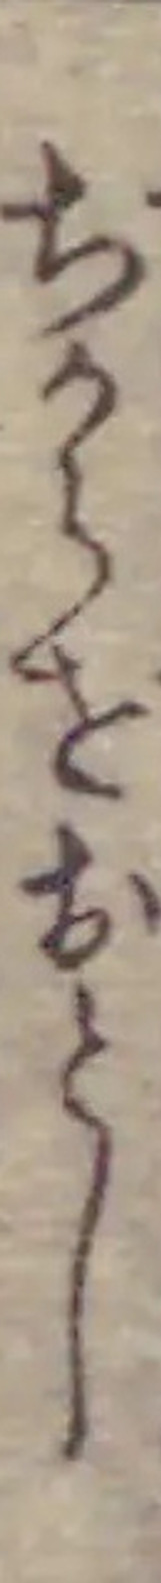ちからをおとし
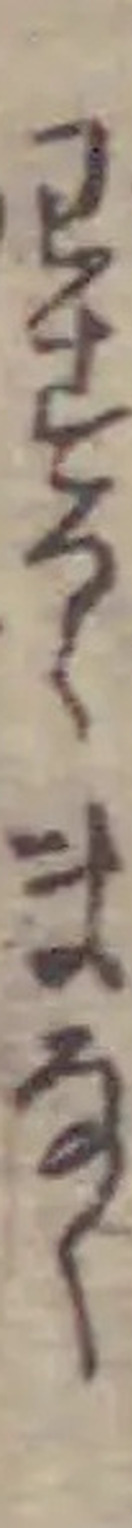わするゝまなく
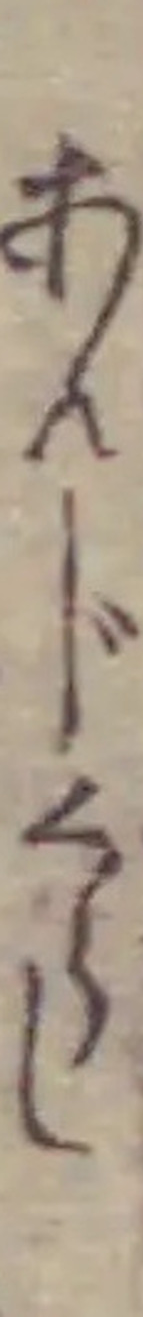あんじくらし
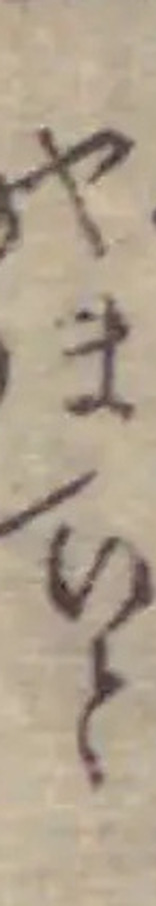やまいと
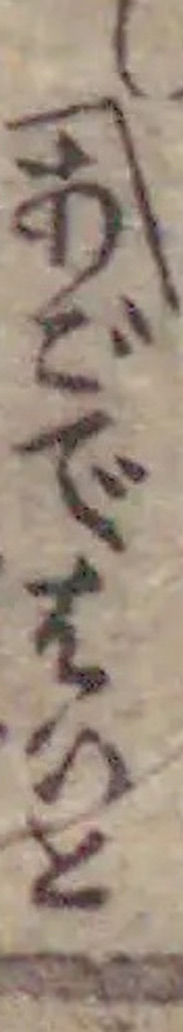〽あごではいと
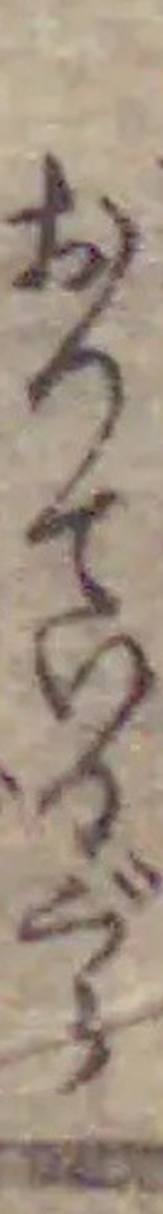おつているぐら
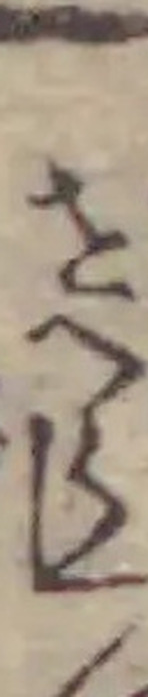をへらし
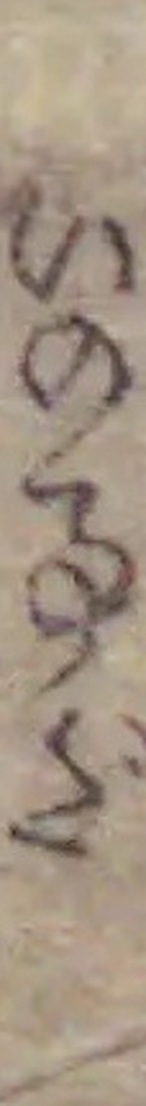いの事だ
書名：腹内養生主論 3巻
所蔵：国立国会図書館 National Diet Library, JAPAN
